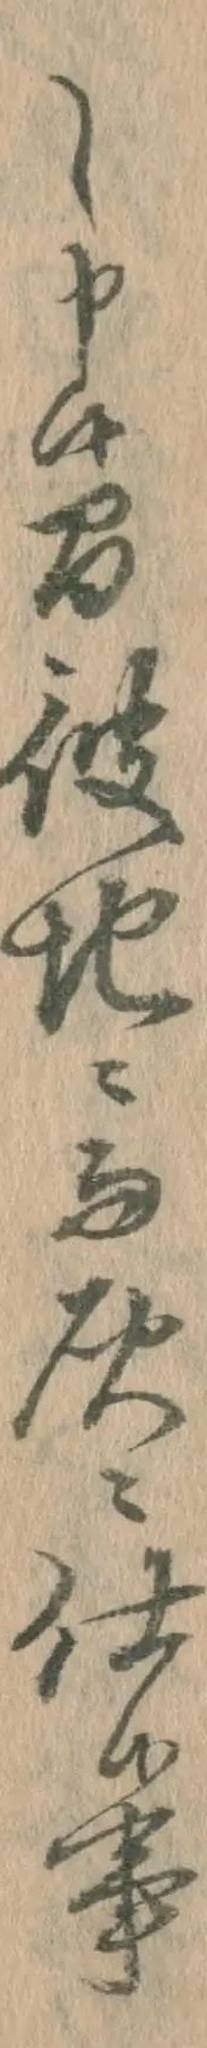し申候間彼地に而灰に仕候事
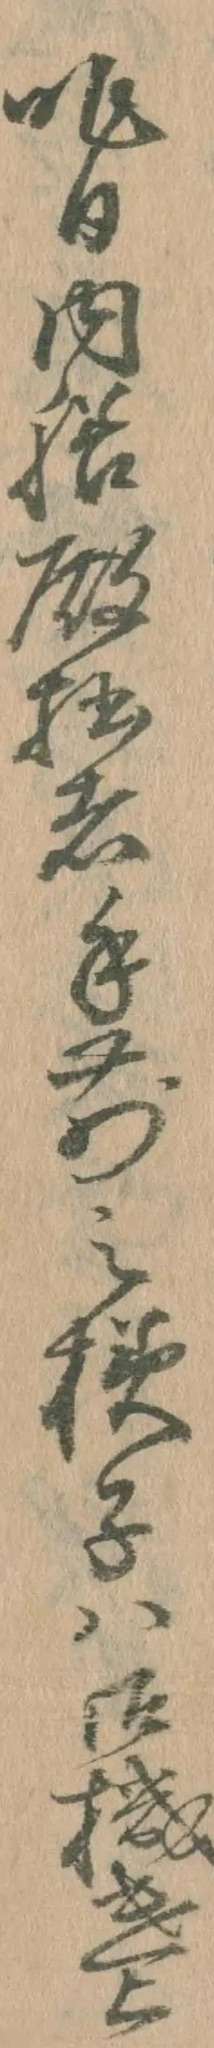一昨日内膳殿拙者手前之様子は御機遣被
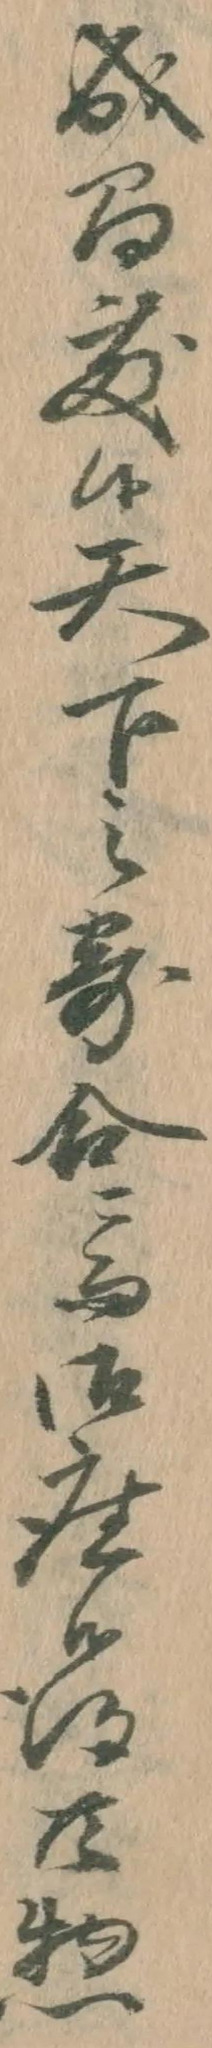成間敷候天下之寄合に而御座候得共惣
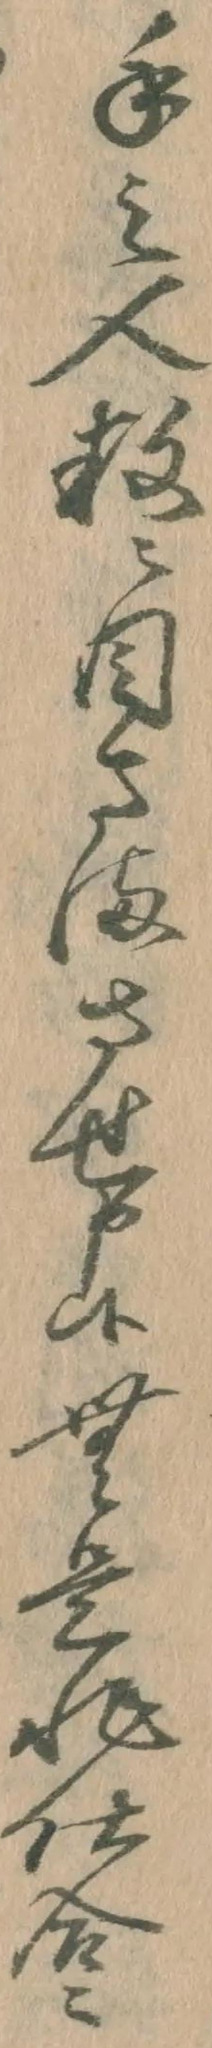手之人数に目さ満させ申候無是非仕合に
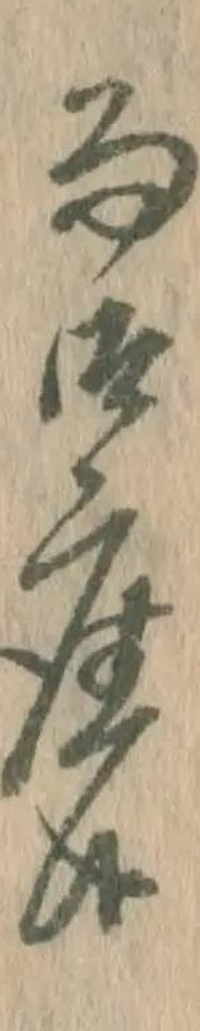而御座候
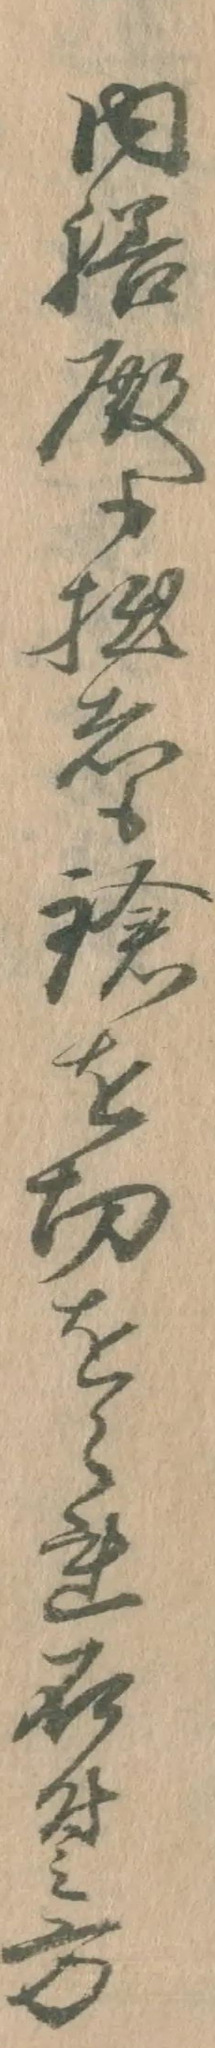一内膳殿も拙者も鎗を切をら連石付之方
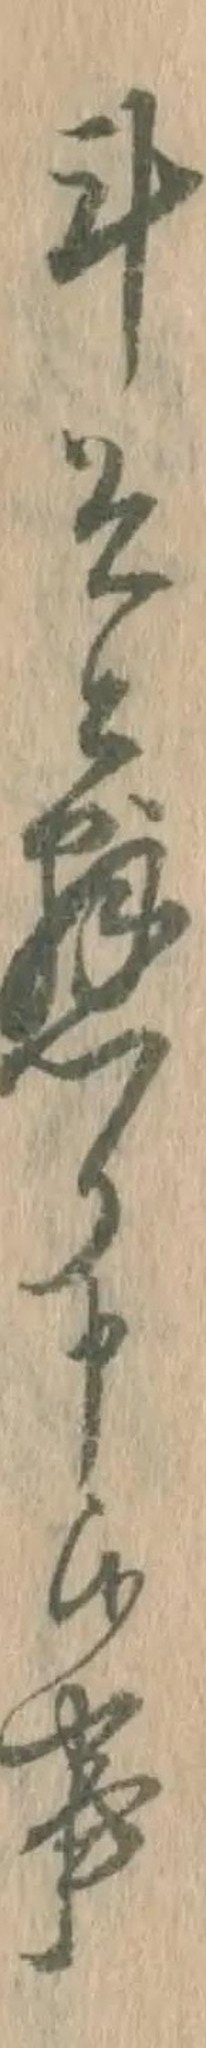斗そと懸り申候事
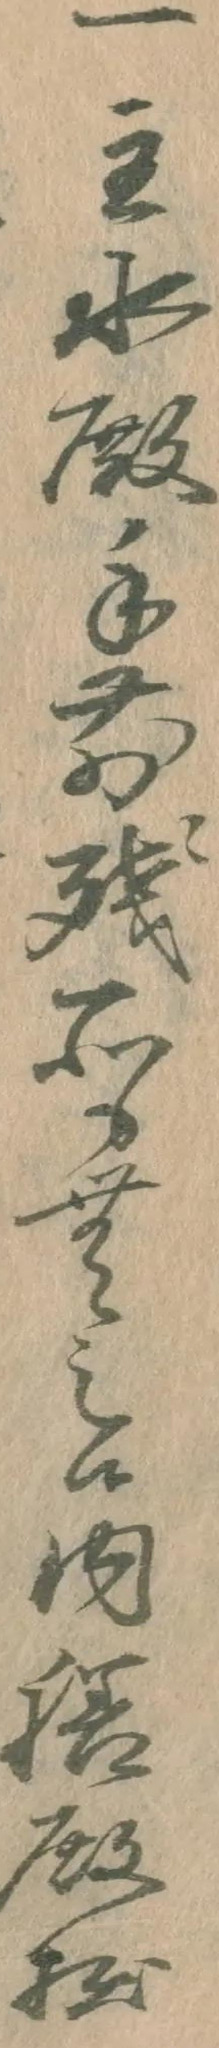一主水殿手前残所も無之候内膳殿拙
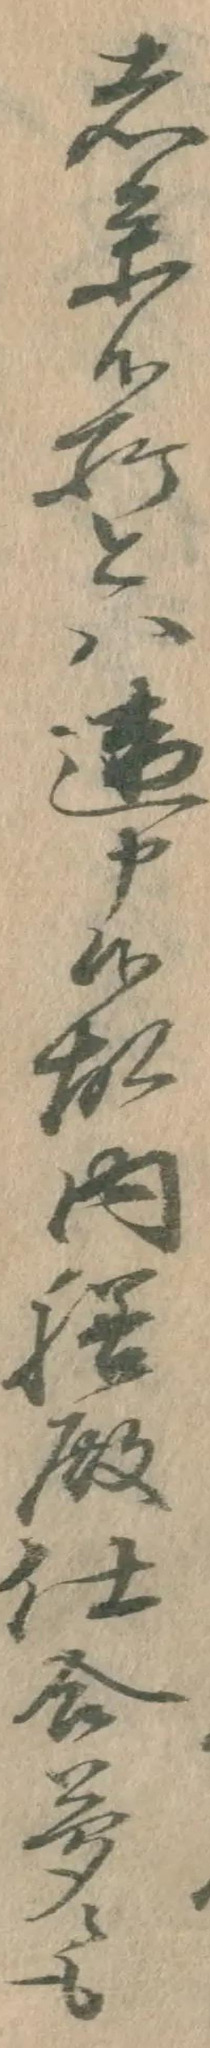者参候所とは違申候故内膳殿仕合夢にも
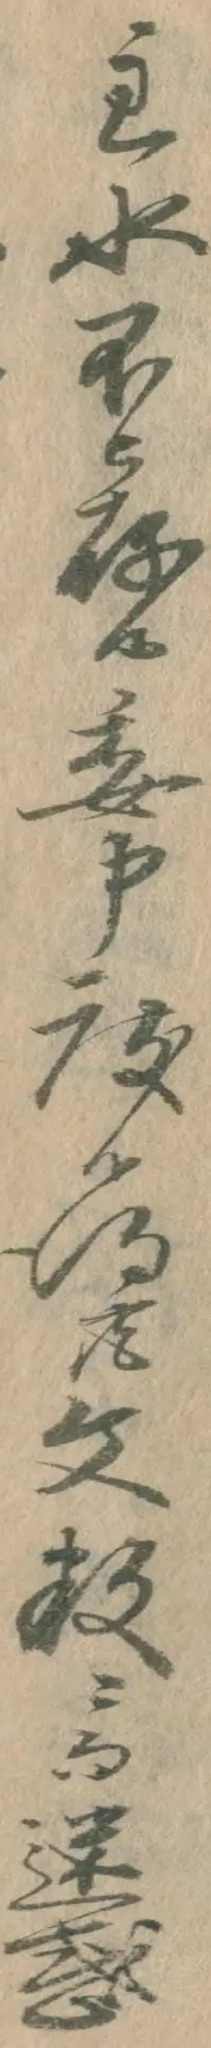主水不被存候委申度候得共父殺に而迷惑
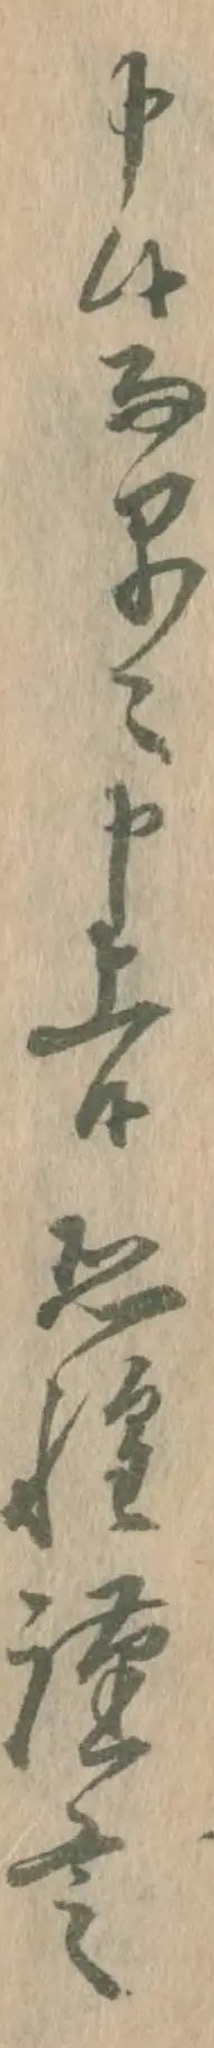申候而早々申上候恐惶謹言
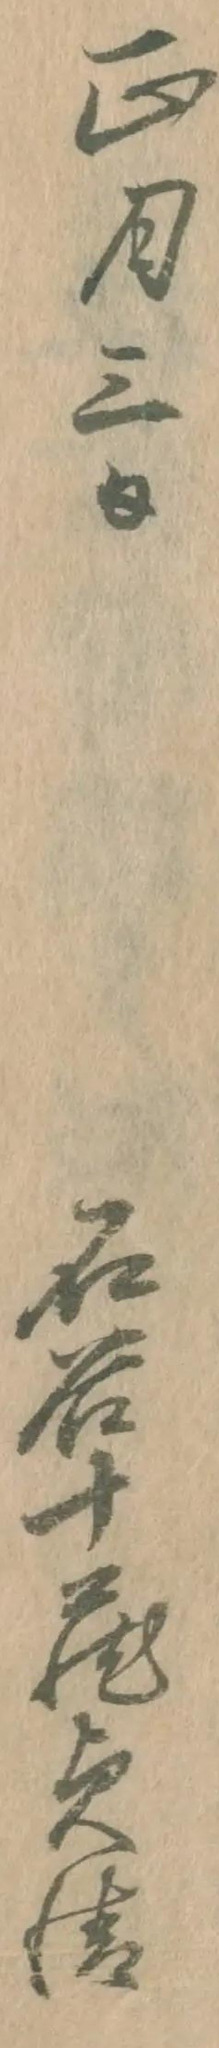正月三日石谷十蔵貞清

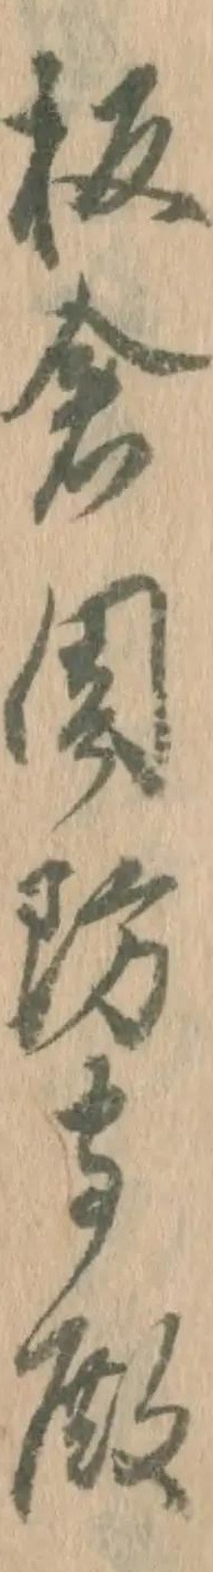板倉周防守殿
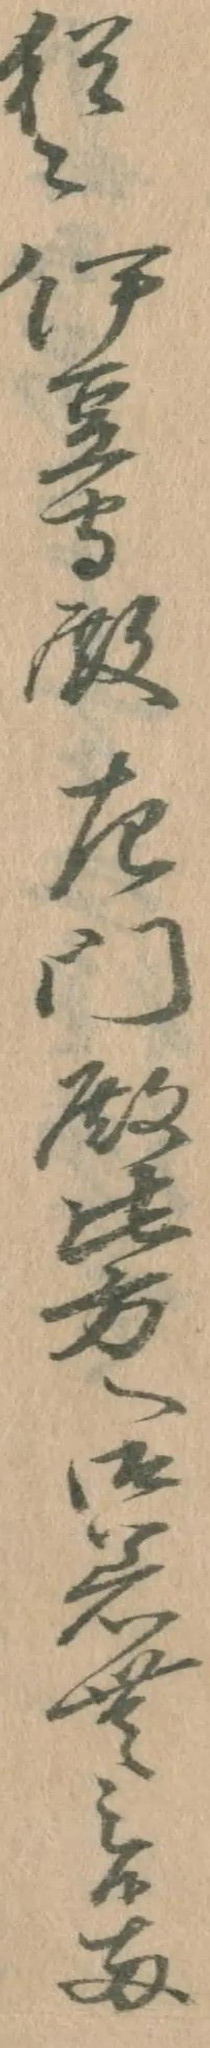猶々伊豆守殿左門殿此方へ御着無之候両
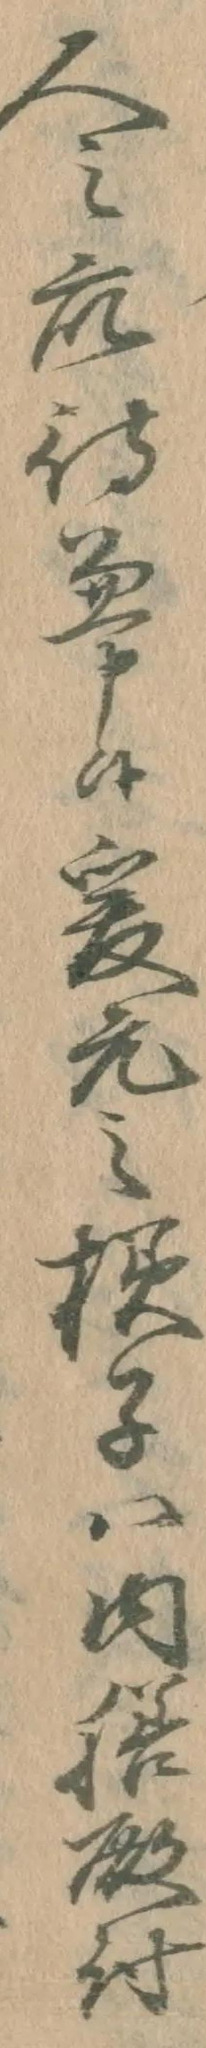人之衆待兼申候爰元之様子は内膳殿討
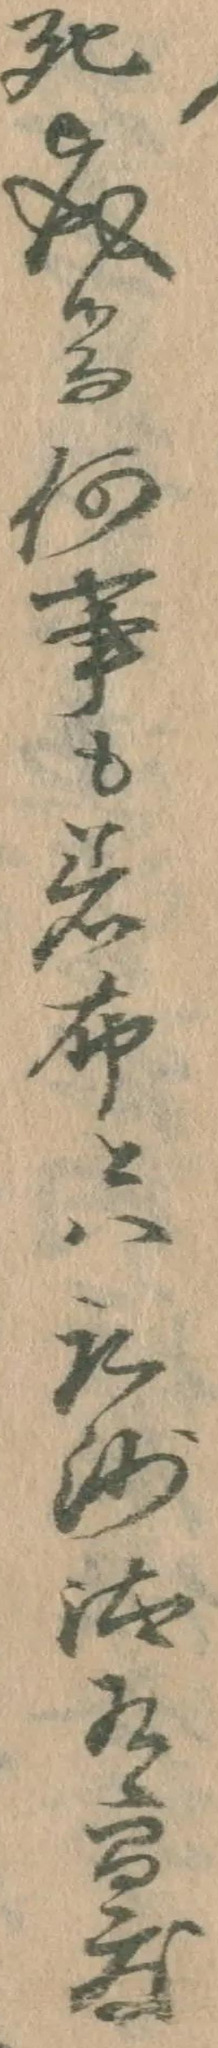死被成候而何事も着布とは取沙汰有間敷
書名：切支丹御退治記 49巻. [5]
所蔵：国立国会図書館 National Diet Library, JAPAN
